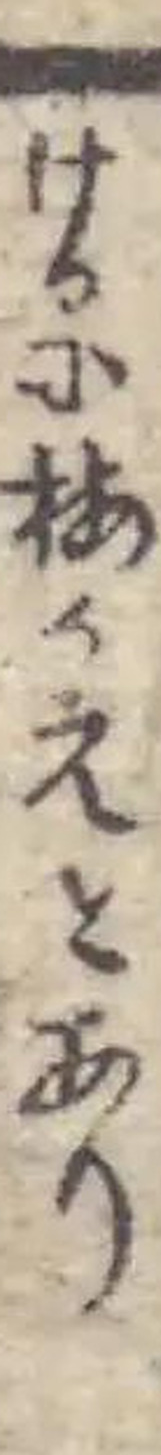けるに梅かえとあり
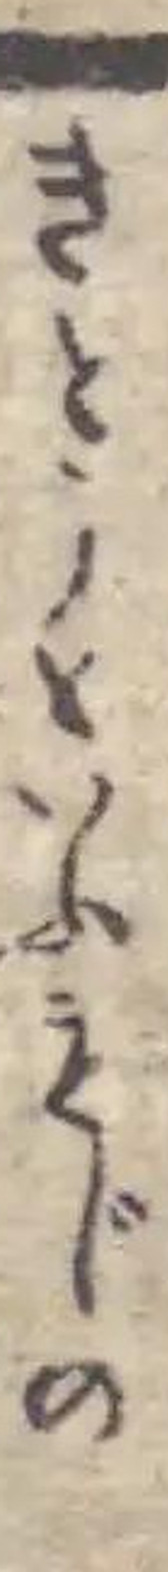きとうといふもじの
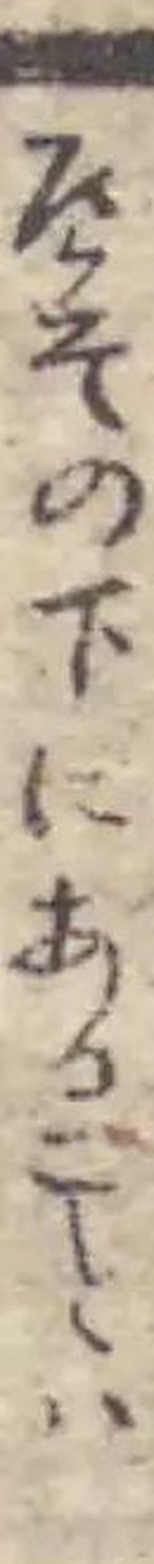へその下にあることは
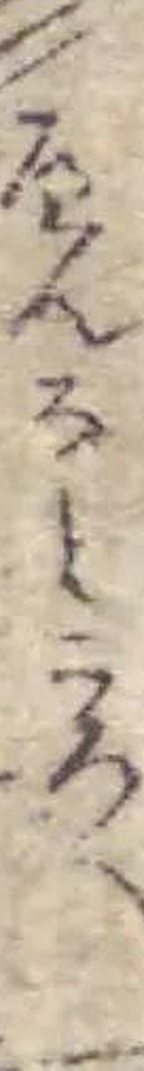へんなところへ
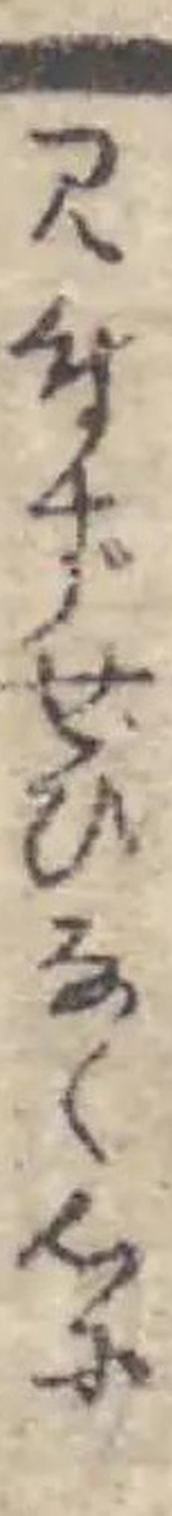見付ずせひなく心に
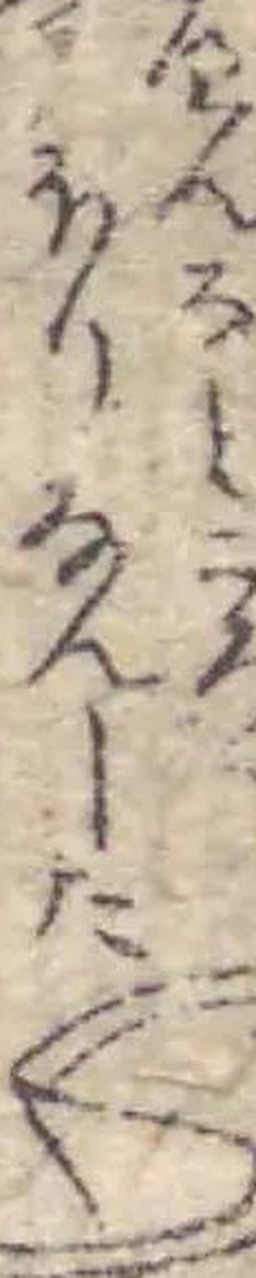ほりなんした
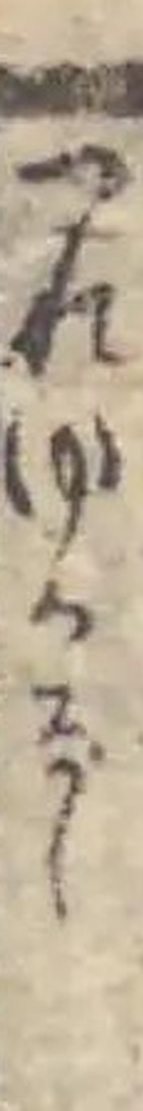つれゆかるゝ
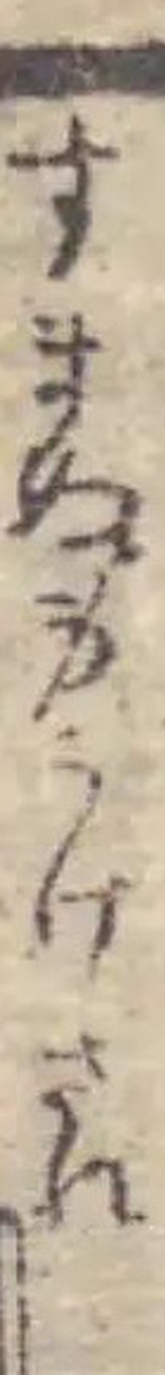すまぬ見うけされ
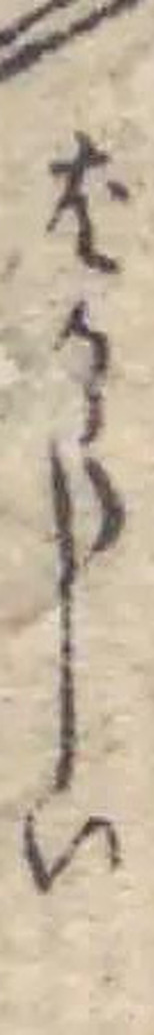ばからしい
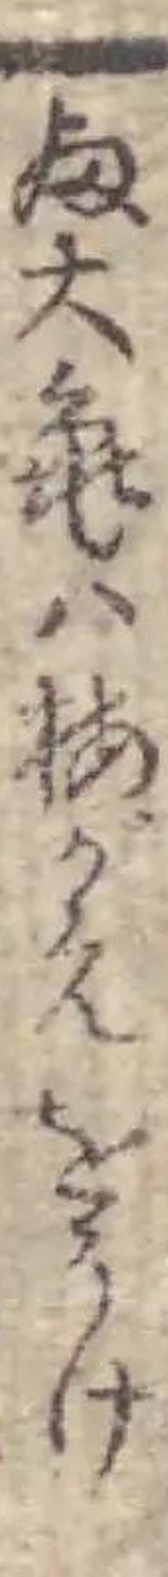扨大亀は梅がえをうけ
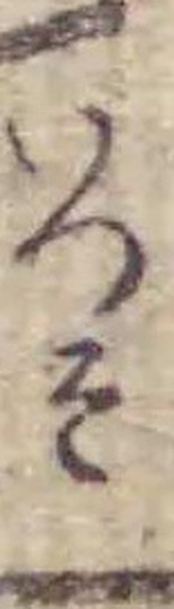いつそ
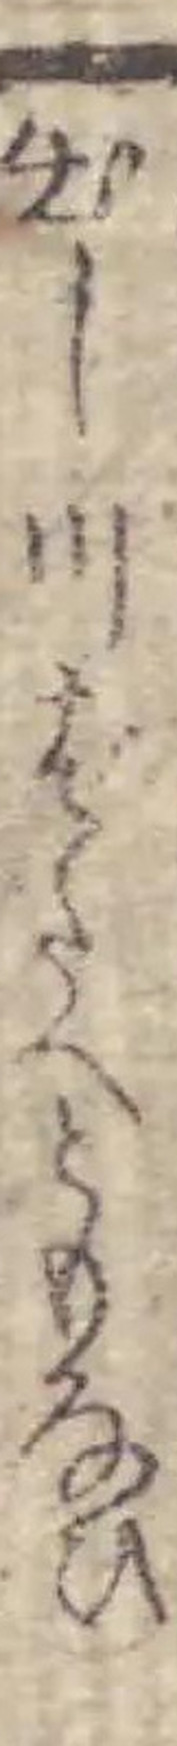出し川はたへともなひ
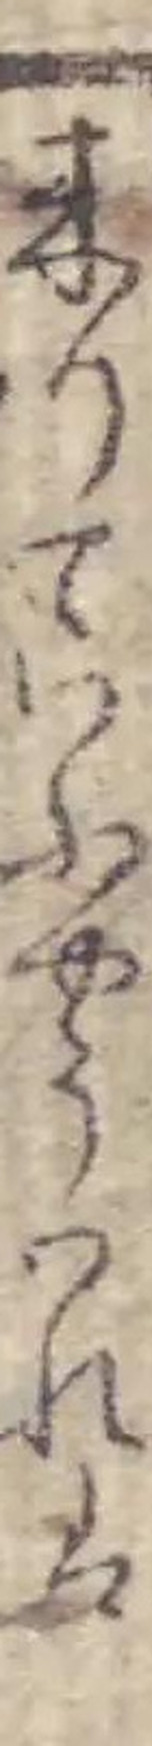来りていふやうわれは
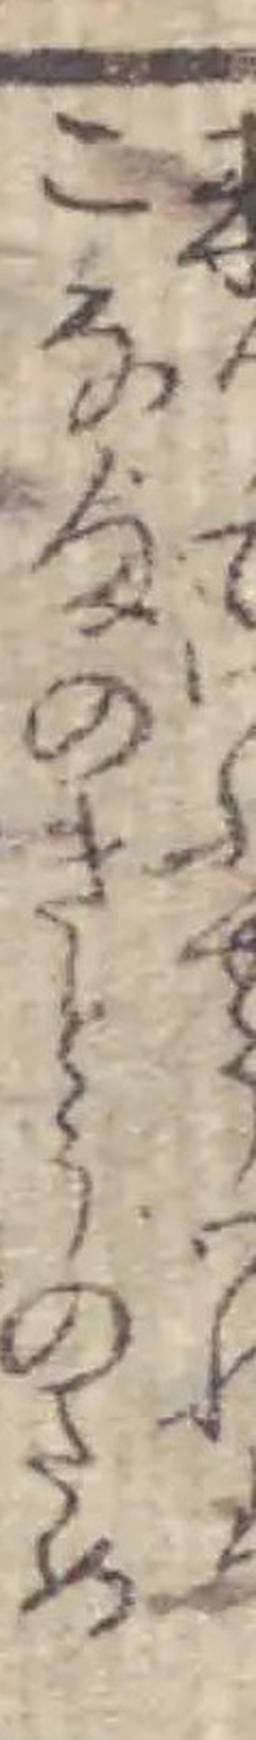こなたのきとうのため
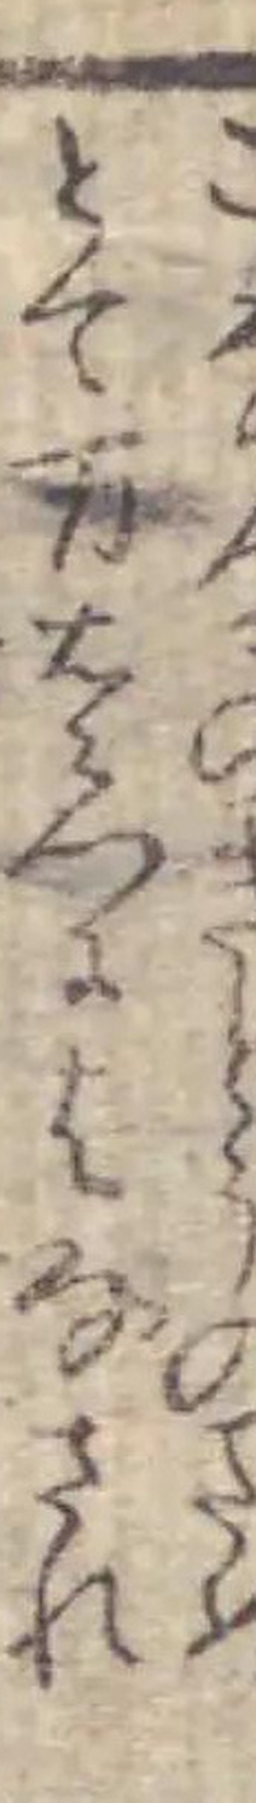とて万右衛門にはなされ
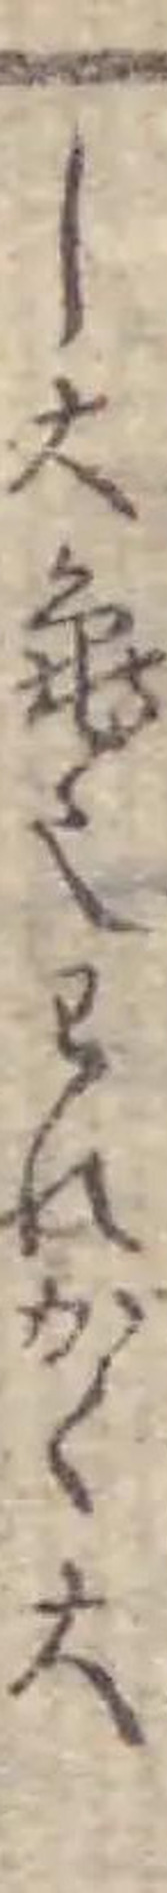し大亀也われかく大
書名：見立蓬莱 : 2巻
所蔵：国立国会図書館 National Diet Library, JAPAN
